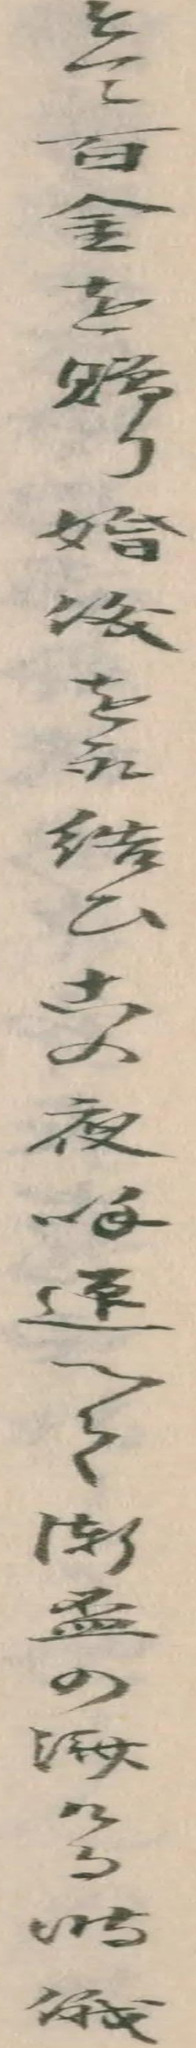とて百金を贈り婚儀を取結ひこの夜呼迎へて漸盃の濟ける時俄
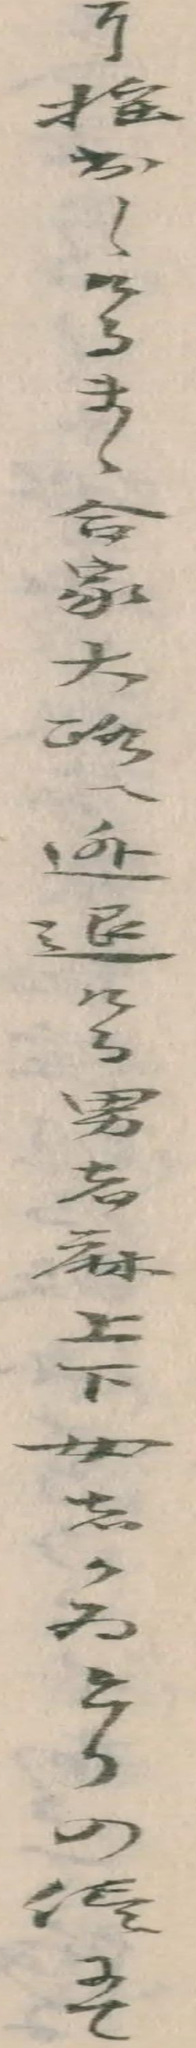に揺出しけるまゝ合家大路へ逃退ける男は麻上下女はかゐとりの侭にて
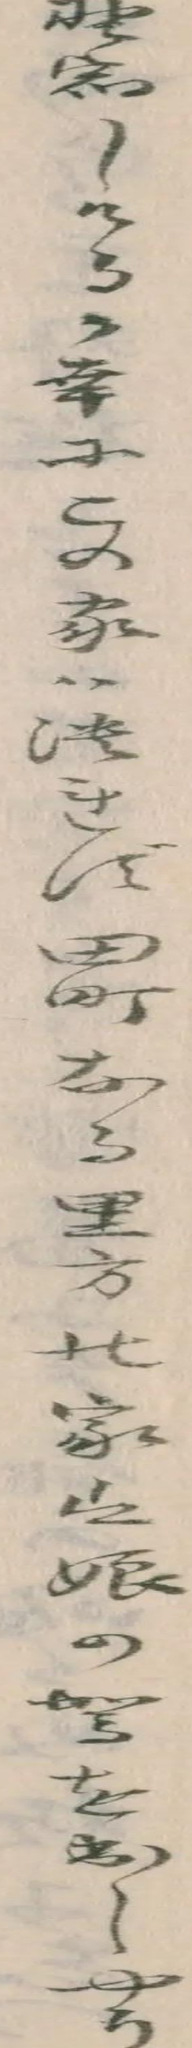野宿しけるか幸にこの家は潰れず田町なる里方の家は娘の駕を出しやり
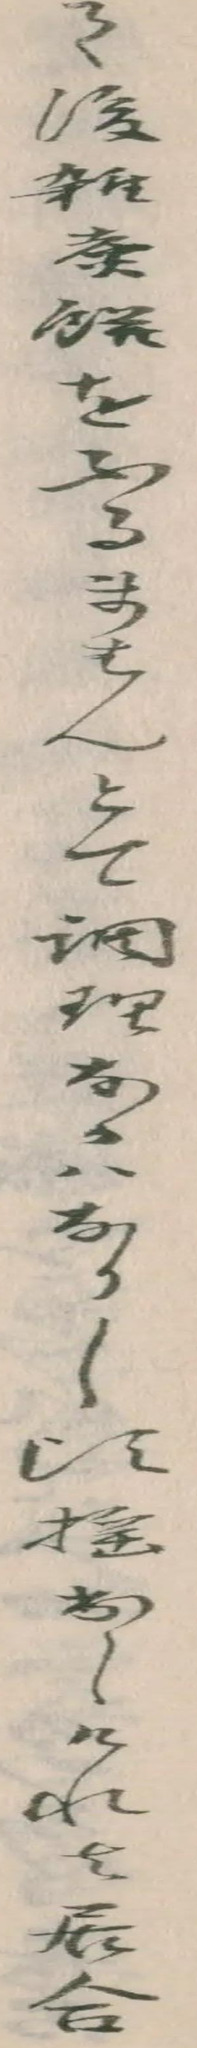て後雑煮餅をふるまはんとて調理なかはなりし頃揺出しけれは居合
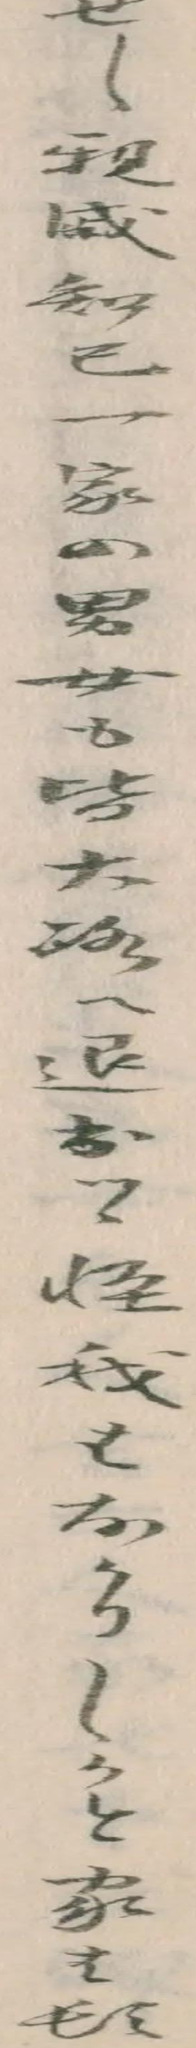せし親戚知己一家の男女も皆大路へ退出つゝ怪我もなかりしかと家は頓
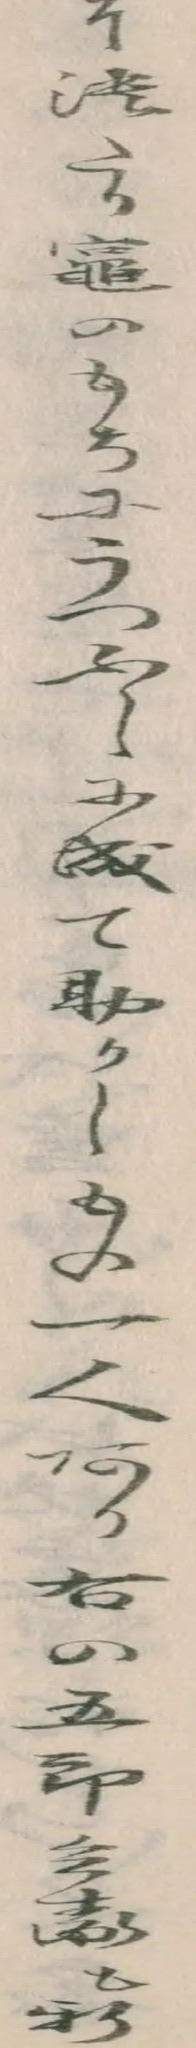に潰たり竃のもちにうつふしに成て助りしもの一人あり右の五郎兵衛も新
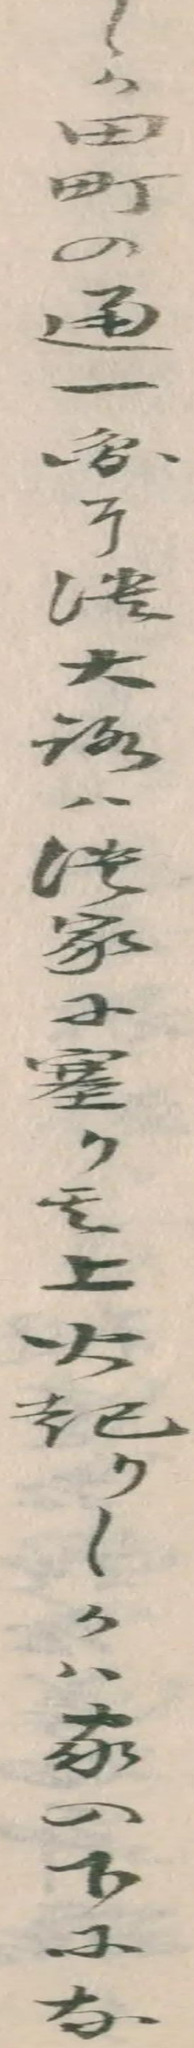しか田町の通り一円に潰大路は潰家に塞り其上火起りしかは家の下にな
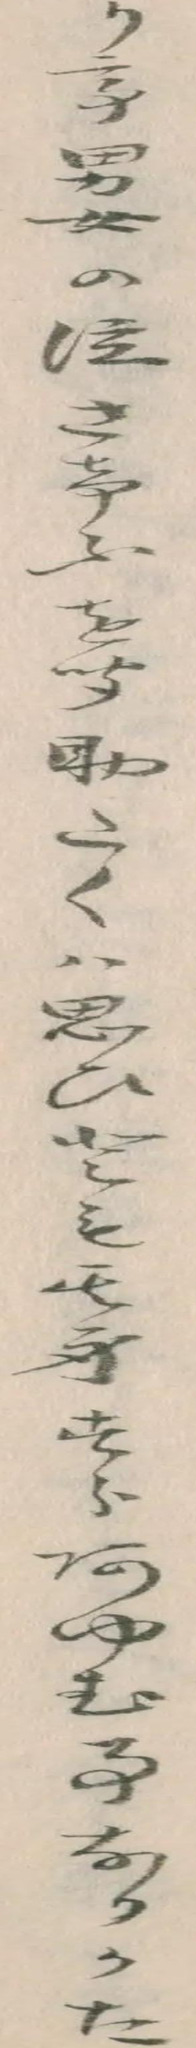りて男女の泣さけふを聞助たくは思ひとも其身すらあゆむ事なりかた
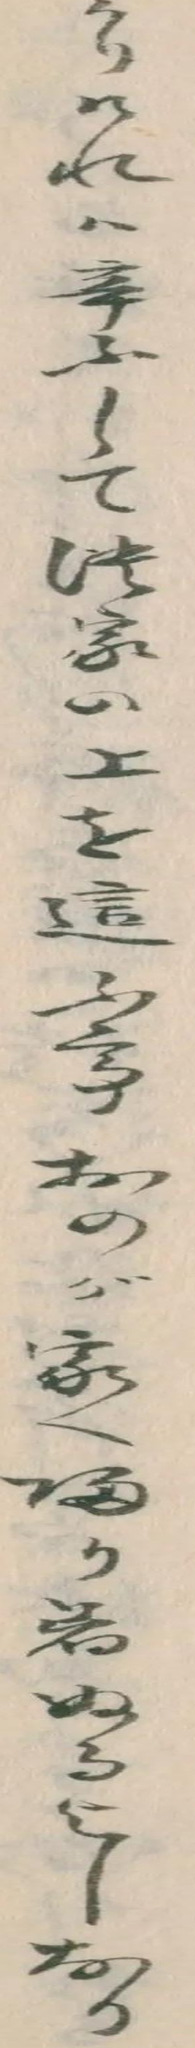かりけれは辛ふして潰家の上を這ふておのが家へ帰り着ぬるよしなり

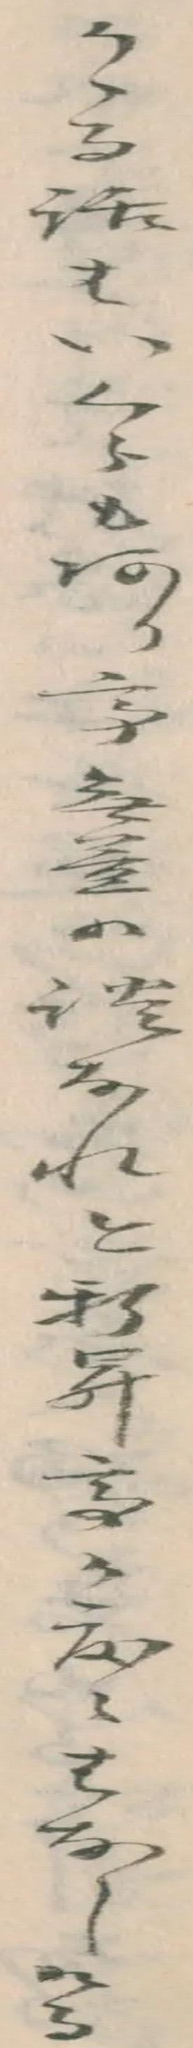かゝる話はいくらもありて無益の談なれと新昇亭か度々はなしける
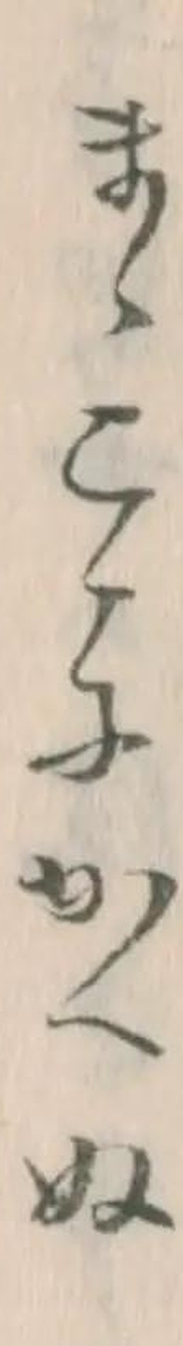まゝこゝにかへぬ
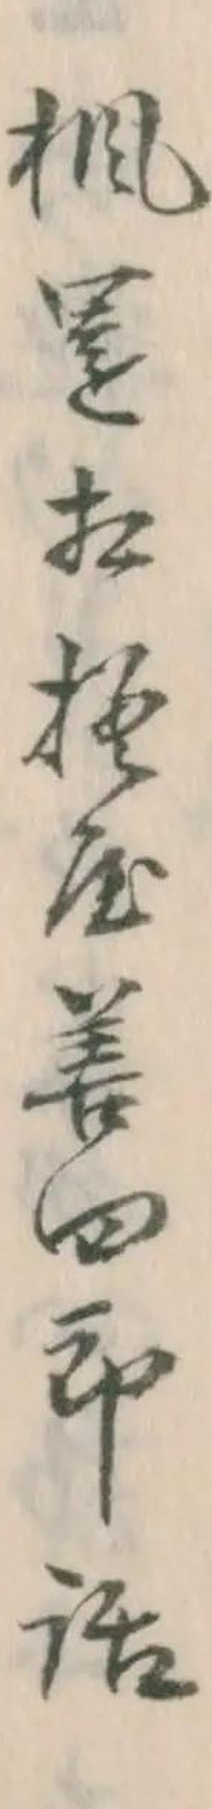楓園相模屋善四郎話
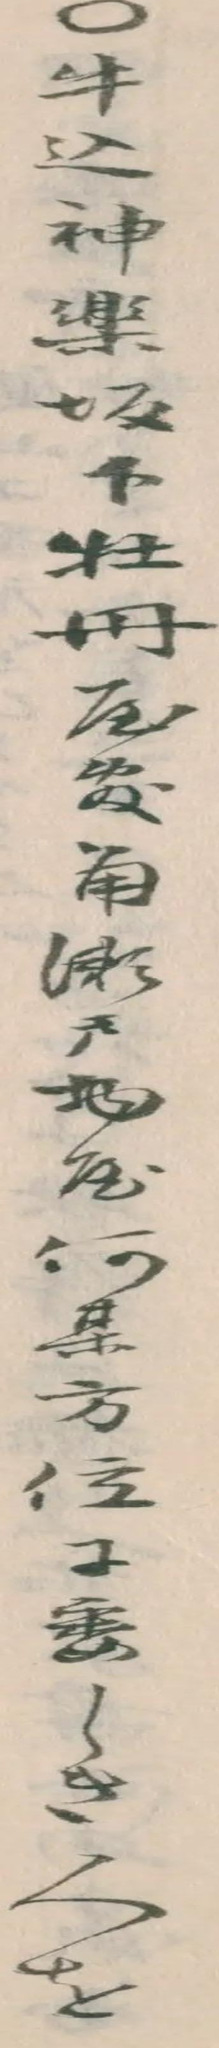〇牛込神楽坂下牡丹屋敷角瀬戸物屋何某方位に委しき人を
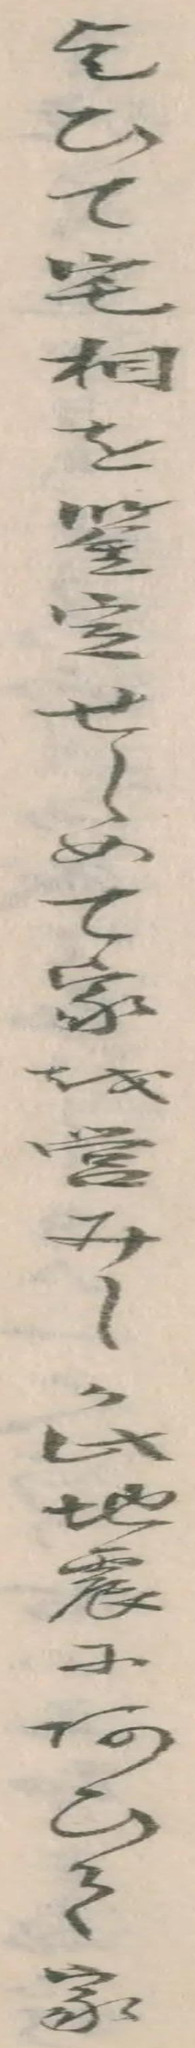よひて宅相を鑒定せしめて家を営みしか此地震にあひて家
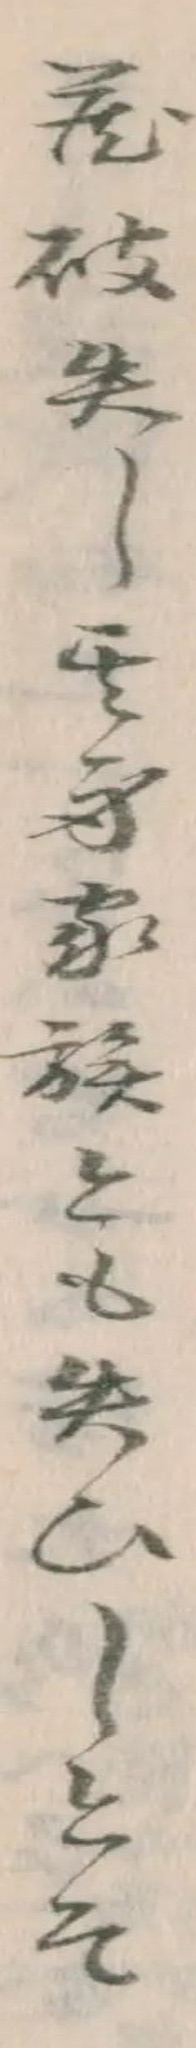藏破失し其身家族とも失ひしとそ
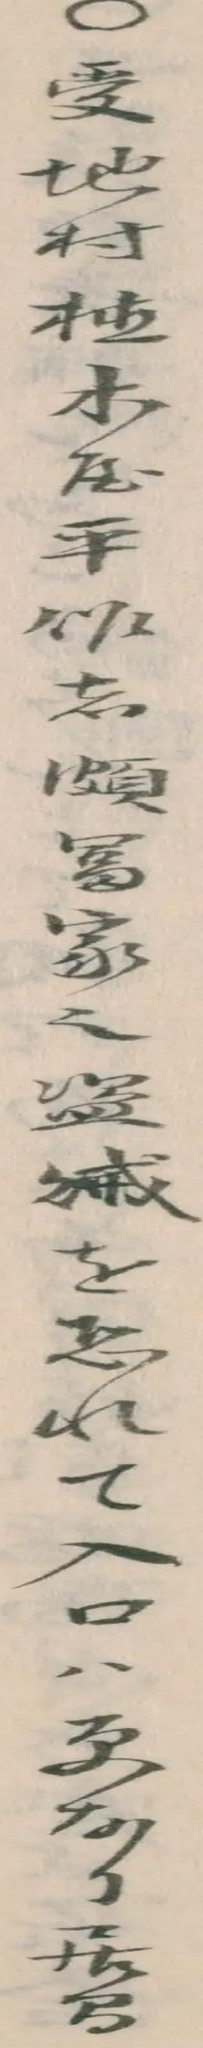〇受地村植木屋平作は頗冨家也盗賊を恐れて入口は更なり居間
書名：地災撮要. 巻7-9(地震之部)
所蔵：国立国会図書館 National Diet Library, JAPAN
